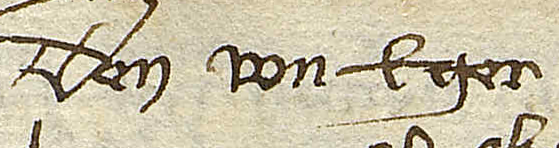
Den von Eger
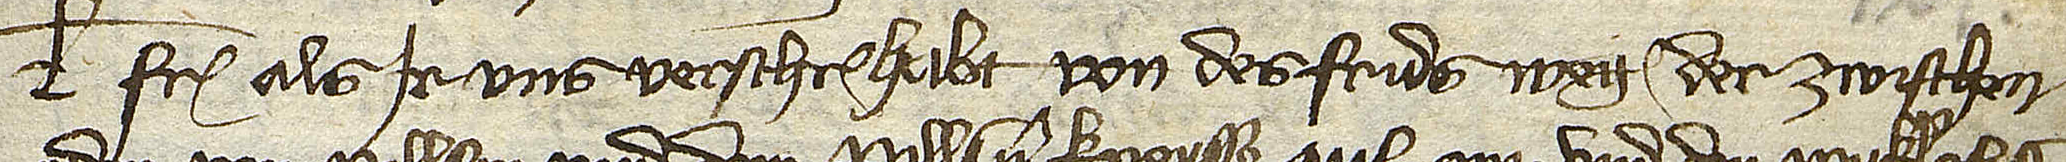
L* fr* als Ir vns verſchr* habt von des frids weg* der cʒwiſchen
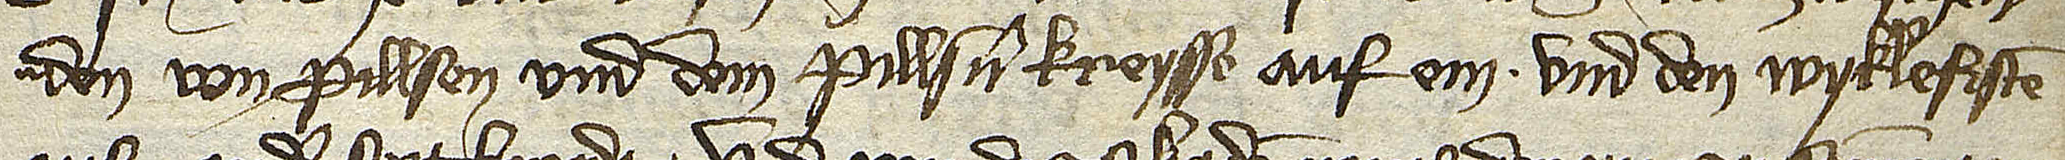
den von Pillſen vnd dem Pillſn* kreyſſe auf ein . vnd den wyklefiſte*
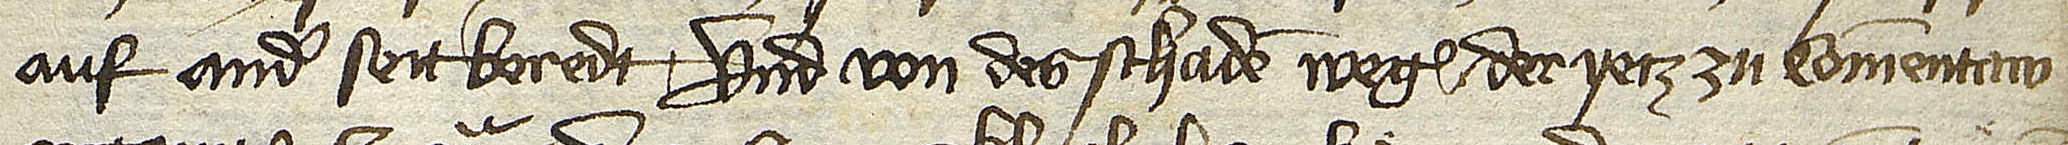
auf and* ſeit beredt / Vnd von des ſchade* weg* / der yecʒ cʒu Comentaw*
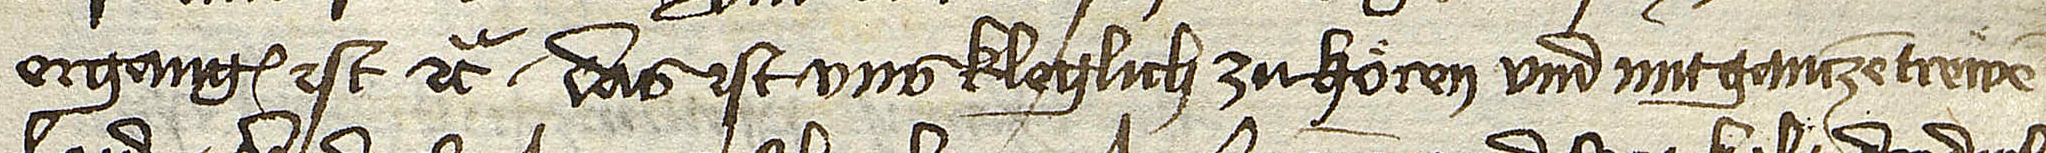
ergang* iſt ec* / das iſt vns kleglich ʒu hören vnd mit gancʒe* trewe*
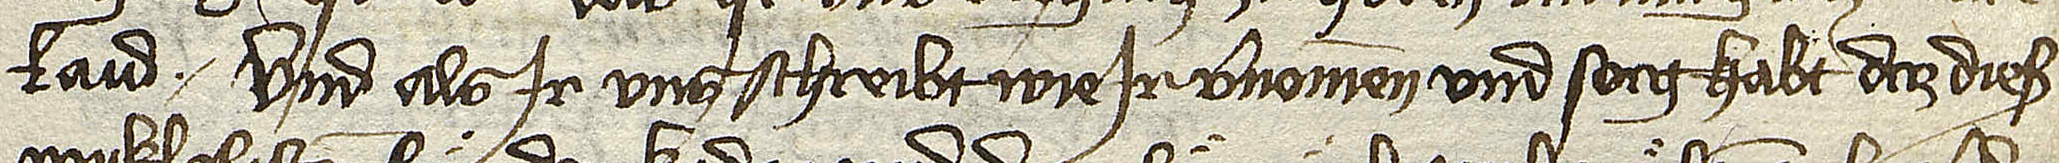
laid / vnd als Ir vns ſchreibt wie Ir v*nomen vnd ſorg habt daʒ dieſ*
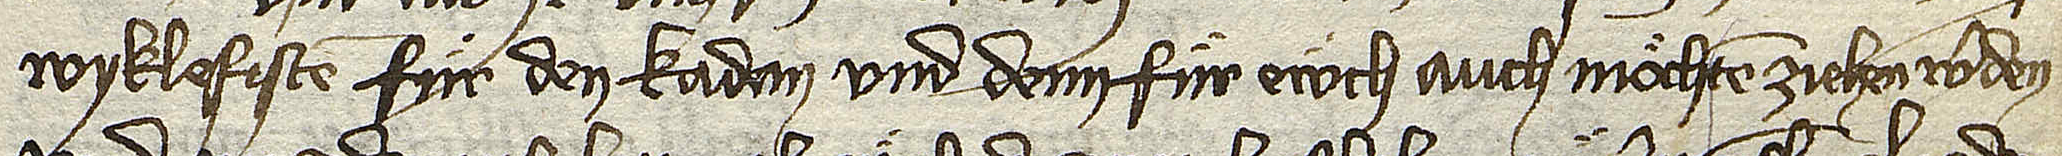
wyklefiſte* für den kadan vnd denn für ewch auch möchte* cʒiehen w*den
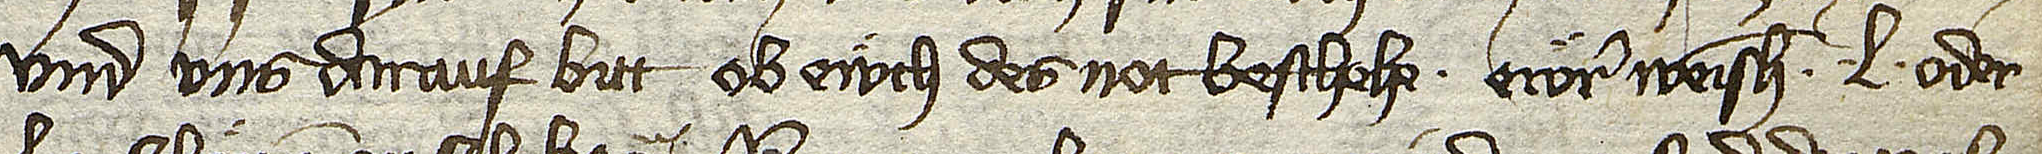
vnd vns darauf bitt ob ewch des not beſchehe . ewr* weiſh* . L . oder
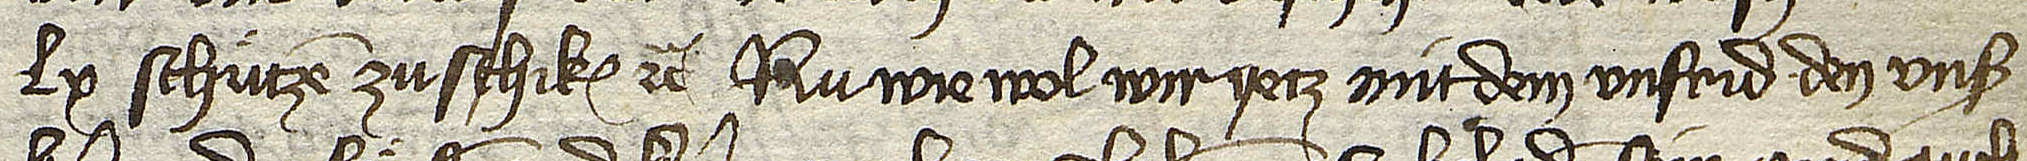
Lx ſchücʒe* ʒu ſchik* ec* Nu wie wol wir yecʒ mit dem vnfrid . den vnſ*
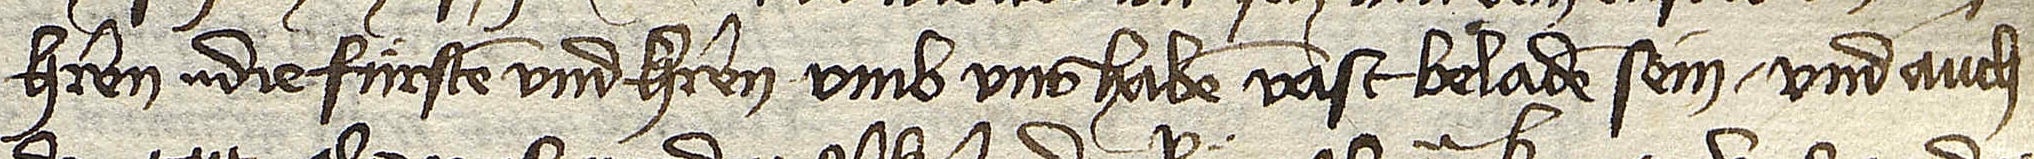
hr*en ~ die fürſte* vnd hr*en vmb vns habe* vaſt belade* ſein / vnd auch
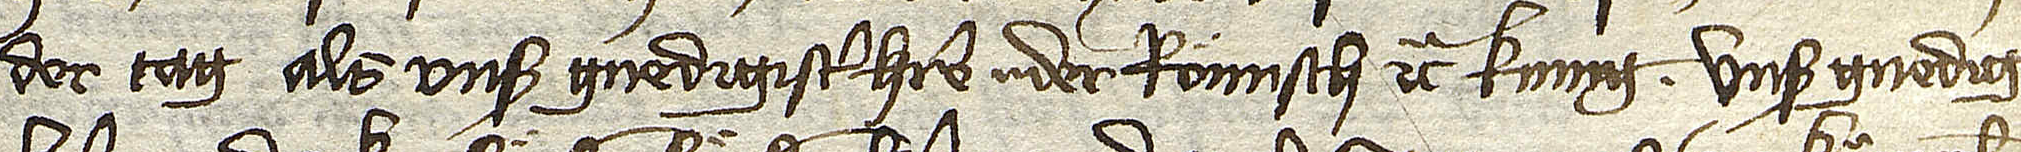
der tag als vnſ* gnedigſt* hr*e ~ der Römiſch ec* kunig . vnſ* gnedig
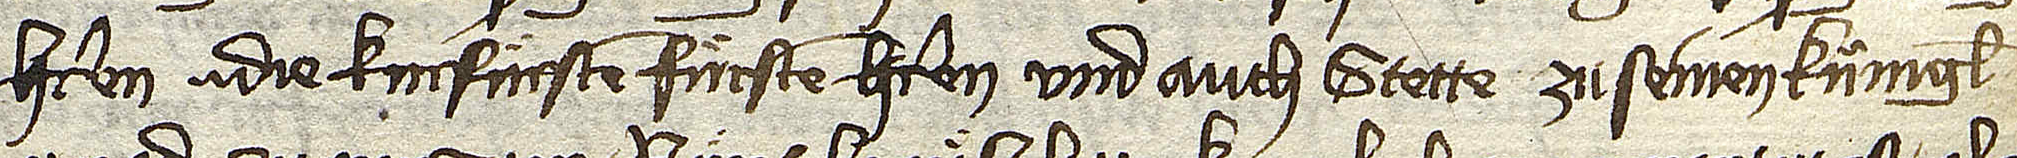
hr*en ~ die kurfürſte* fürſte* hr*en vnd auch Stette ʒu ſeinen künigl*
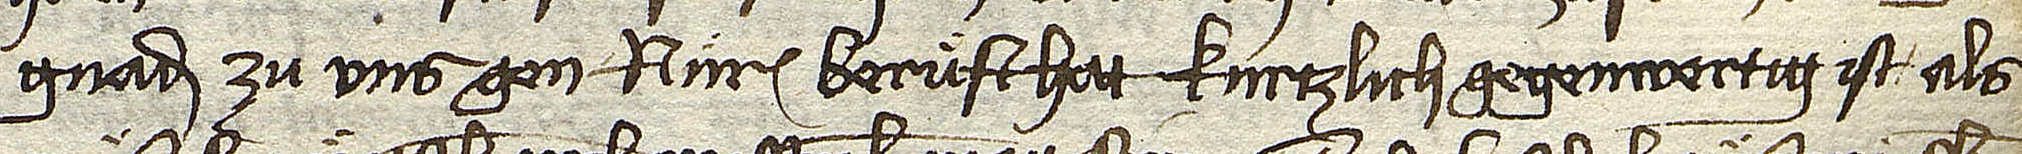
gnad* ʒu vns gen Nür* berüft hat kurcʒlich gegenwertig iſt / als
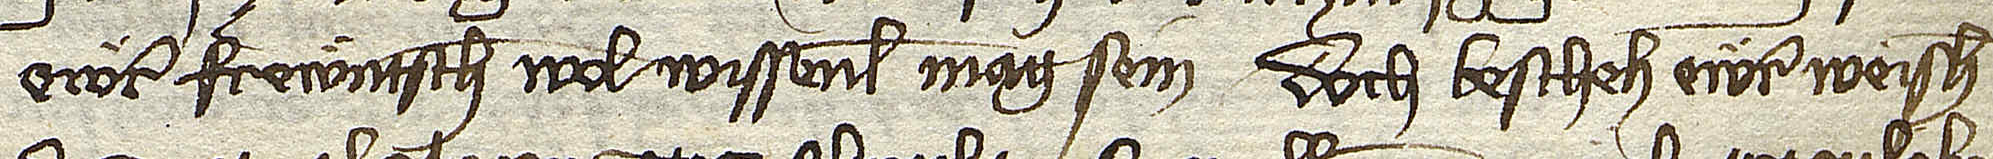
ewr* frewntſch* wol wiſſenl*mag ſein / Doch beſcheh ewr* weiſh*
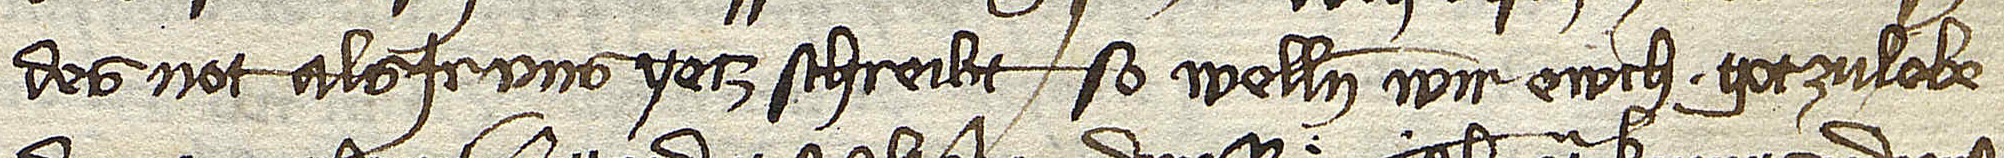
des not als Ir vns yecʒ ſchreibt / ſo welln* wir ewch . gotʒulobe
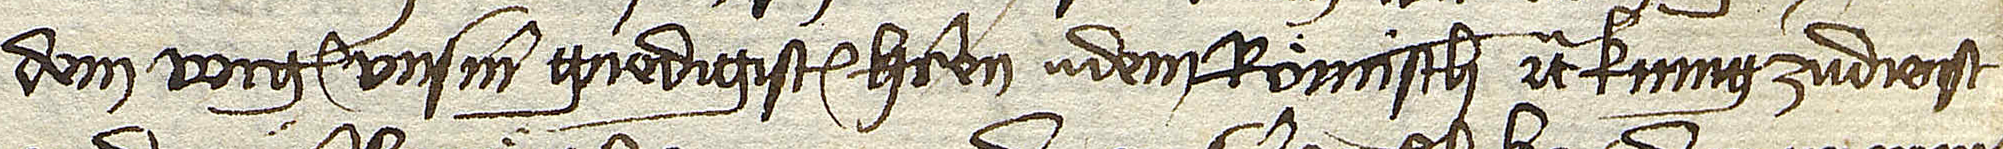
dem vorg* vnſm* gnedigiſt* hr*en ~ dem Römiſch* ec* kunig ʒudienſt
